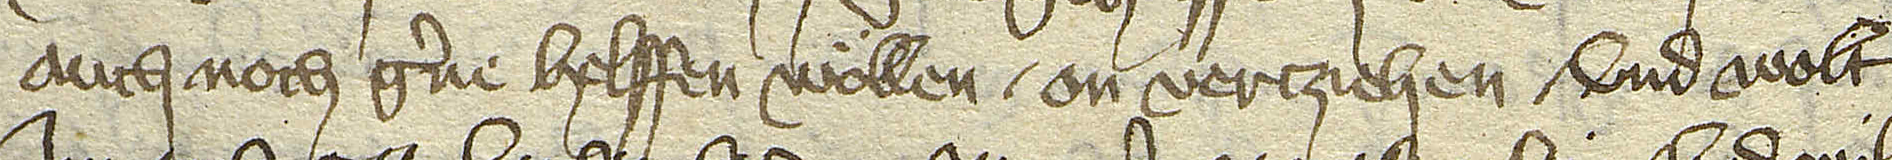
auch noch g*ne helffen wöllen / on vercʒiehen / vnd wolt
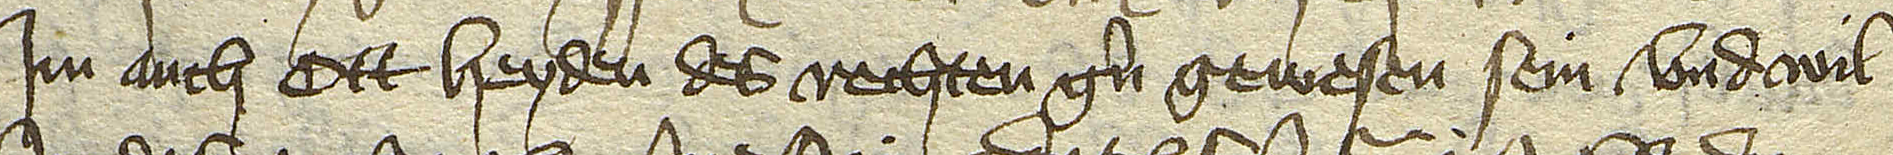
Im auch Ott heyden des rechten g*n geweſen ſein / vnd wil
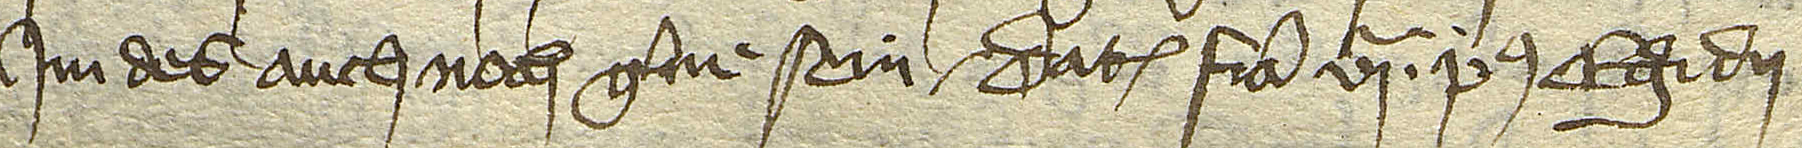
Im des auch noch g*ne ſein / Dat* fia* vi* . p* Egidii
